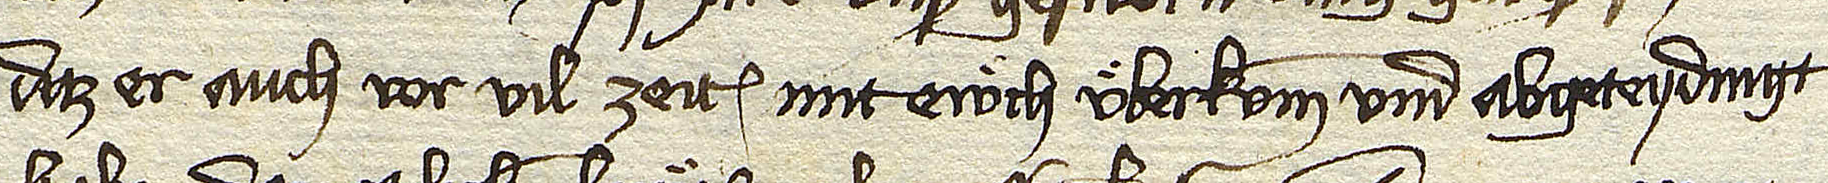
daʒ er auch vor vil ʒeit* mit ewch v̈berkom* vnd abgeteydingt
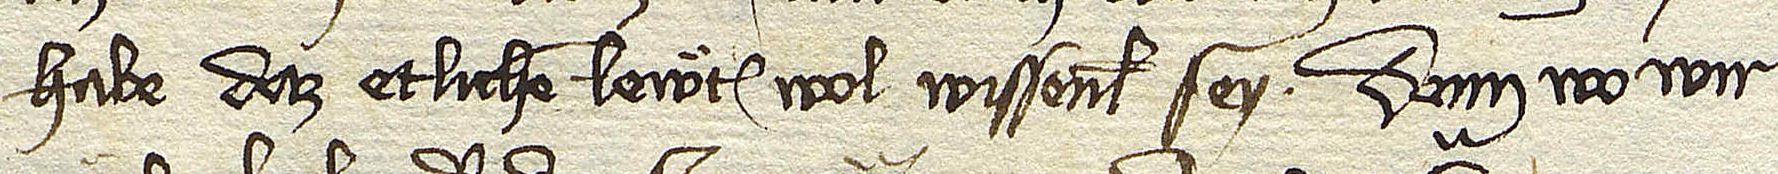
habe daʒ etliche* lewt* wol wiſſenl* ſey . Denn wo wir
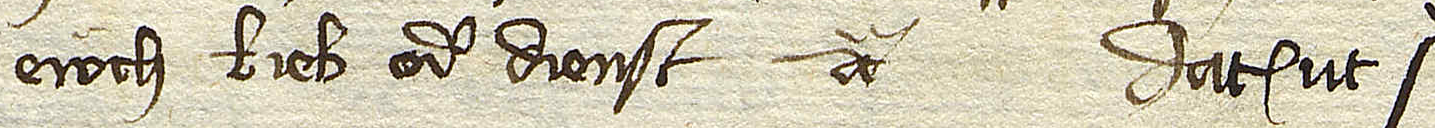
ewch lieb* od* dienſt ec* Dat* ut ſ*
